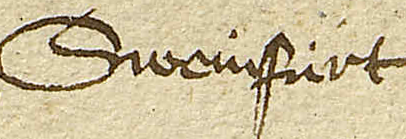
Sweinfürt
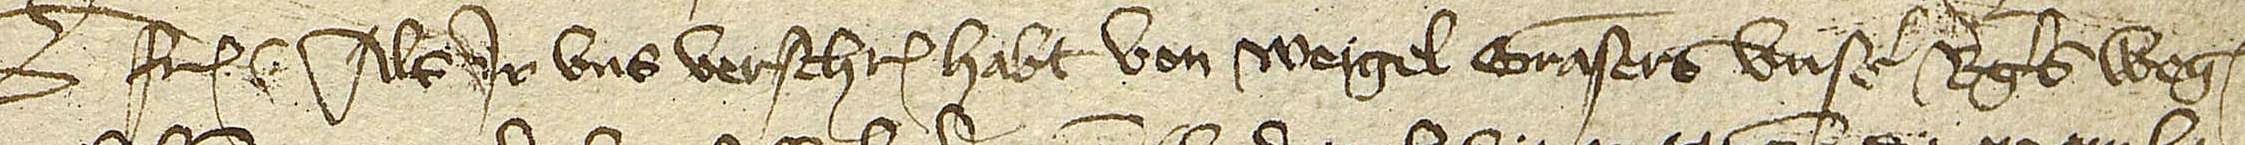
L* fr* / Als Ir vns verſchr* habt von weigel Graſers vnſs* B*g*s weg*
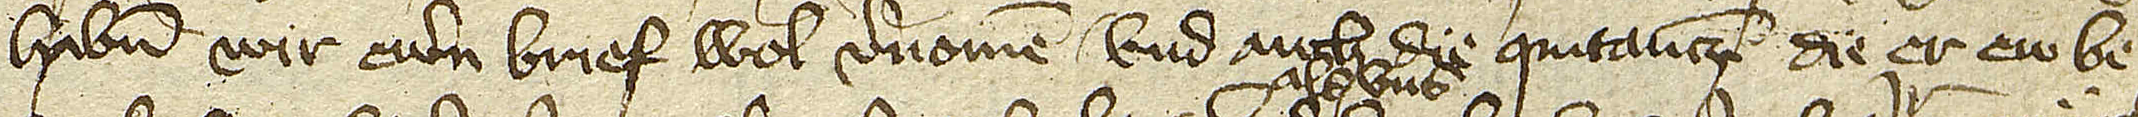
habn* wir ew*n brief wol v*nome* / vnd auch die quitancʒe* die er ew be
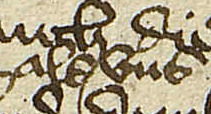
als vns
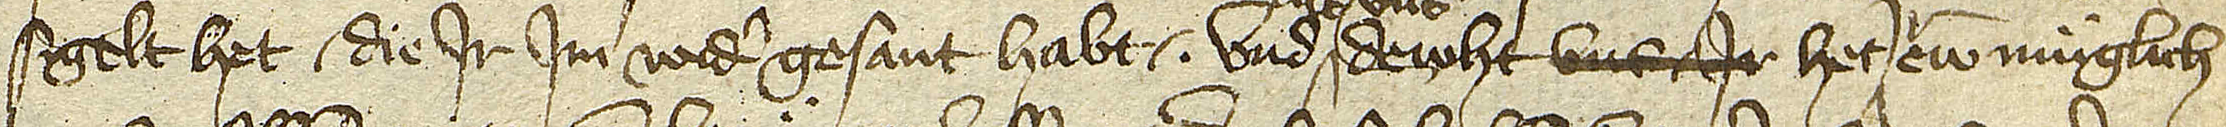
ſigelt het / die Ir Im wid* geſant habt /. vnd dewht vns / Ir het ew müglich
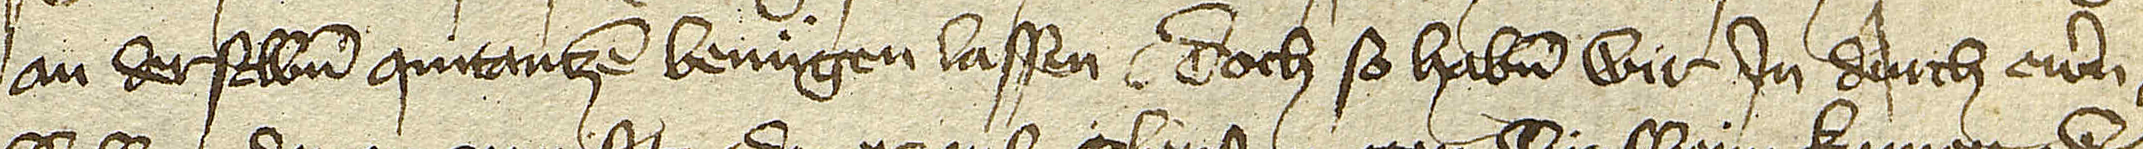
an derſelbn* qintancʒe* benügen laſſen / Doch ſo habn* wir In durch ew*n
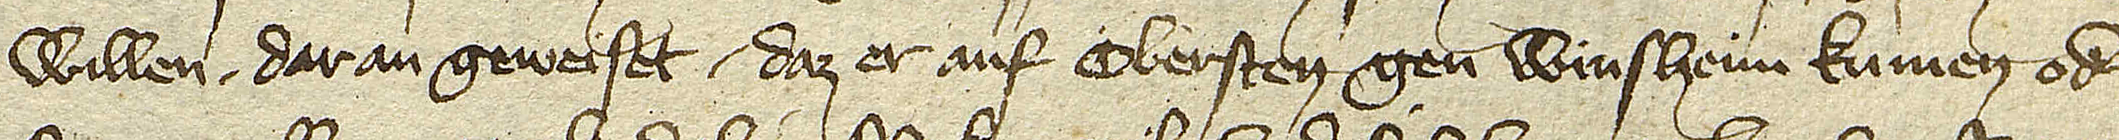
willen / daran geweiſet / daʒ er auf Oberſten gen Winſheim kumen od*
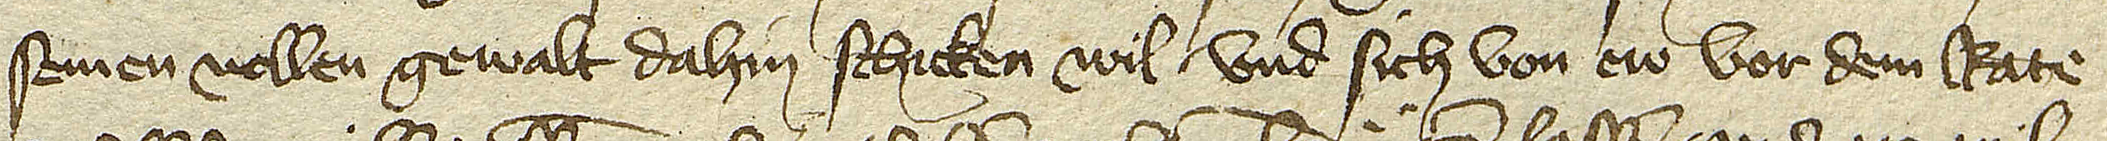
ſeinen vollen gewalt dahin ſchicken wil / vnd ſich von ew vor dem Rate
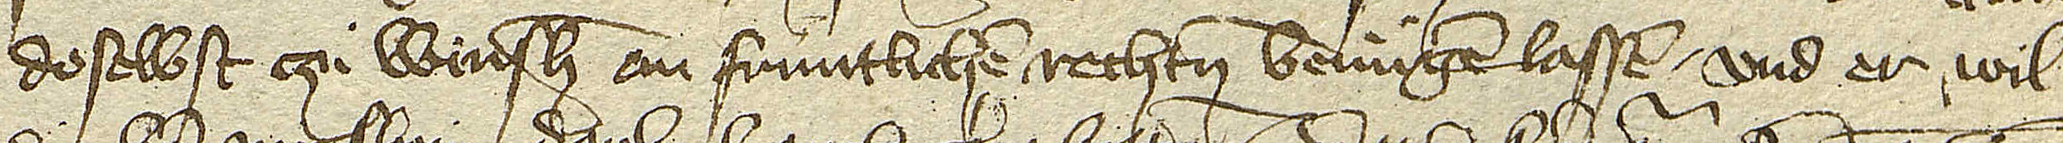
doſelbſt cʒü winſh* an fruntliche* rechtn* benüge* laſſe* / vnd er wil
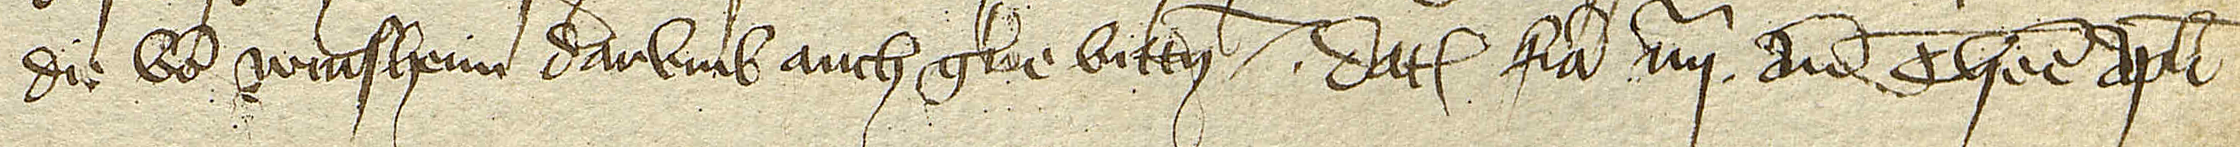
die vo* winſheim darvmb auch g*ne bittn* / . Dat* fia* iiii* . An* Thoe* Apli*
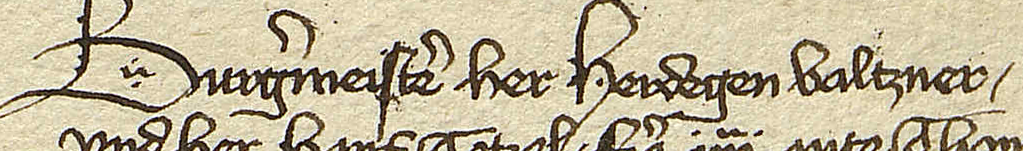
Burg*meiſte* her Herdegen valtʒner /
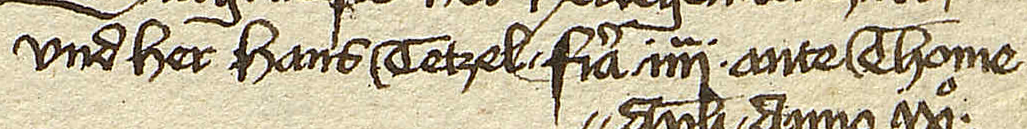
vnd her hans Tetʒel / fia* iiii* . ante Thome
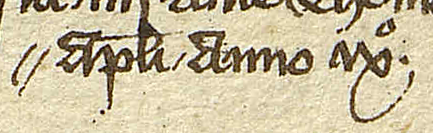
// Apli* / Anno ix* .
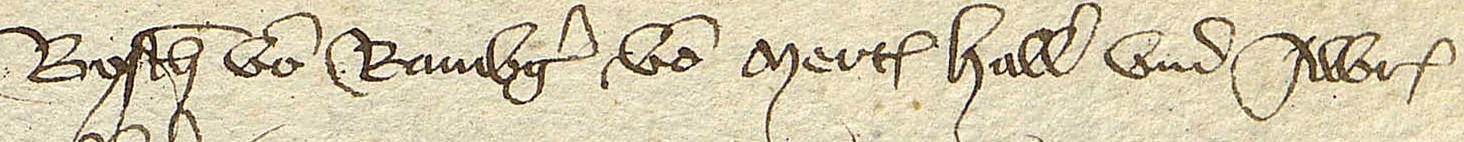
Byſch* vo* Bambg* / vo* Mert* hall* vnd Albr*
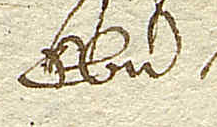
Ebn* /
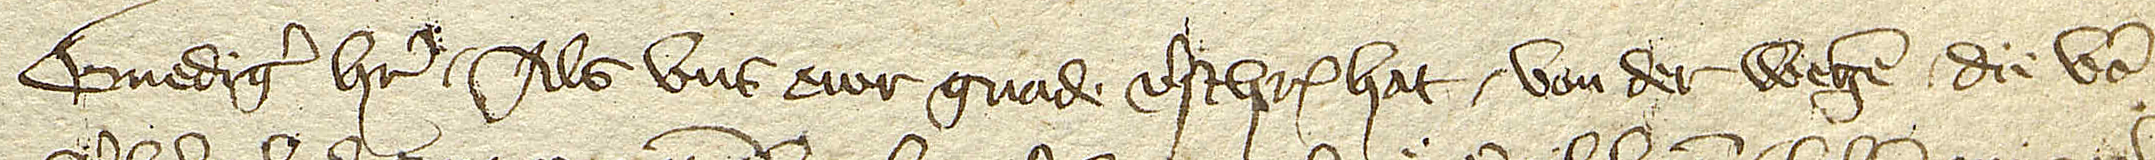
Gnedig* hr* / Als vns ewr gnad v*ſchr* hat / von der wege* / die vo*
